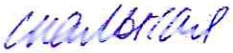скальная
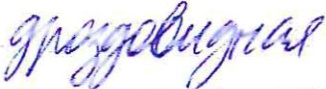дроздовидная
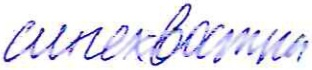синехвостка
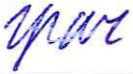грач
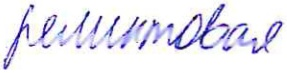реликтовая
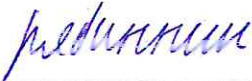рябинник
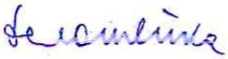белошейка
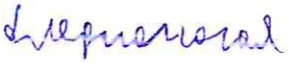бледноногая
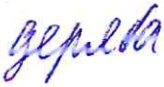деряба
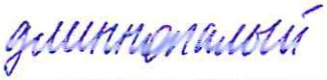длиннопалый
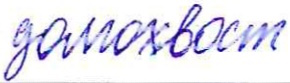долгохвост
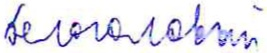белоголовый
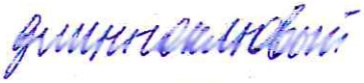длинноклювый
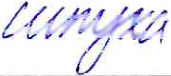сипуха
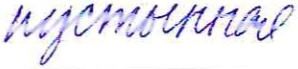пустынная
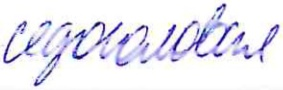седоголовая
